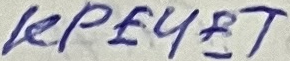кречет
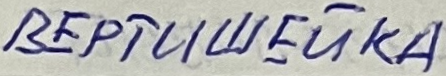вертишейка
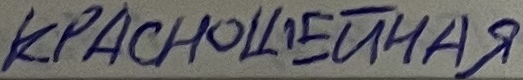красношейная
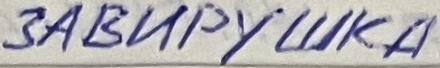завирушка
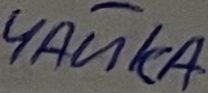чайка
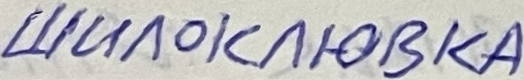шилоклювка
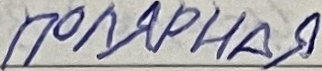полярная
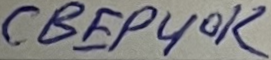сверчок
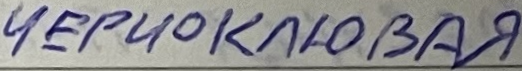черноклювая
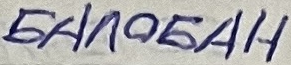балобан
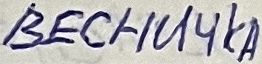весничка
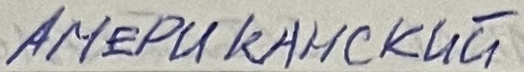американский
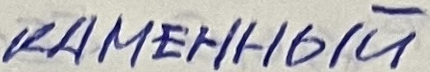каменный
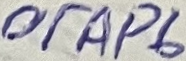огарь
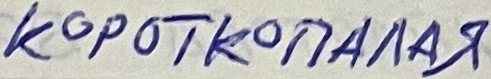короткопалая
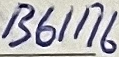выпь
